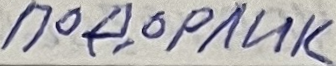подорлик
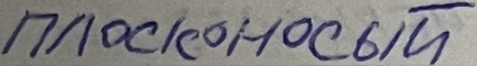плосконосый
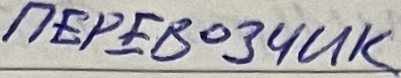перевозчик
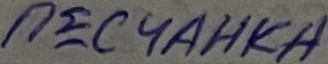песчанка
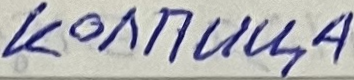колпица
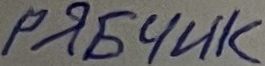рябчик
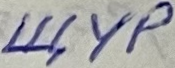щур
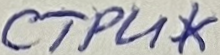стриж
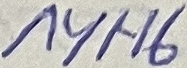лунь
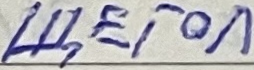щегол
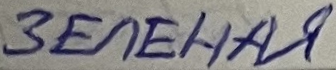зеленая
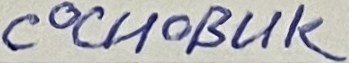сосновик
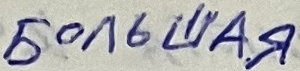большая
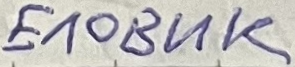еловик
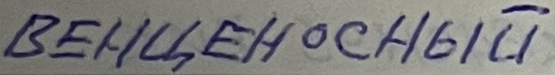венценосный
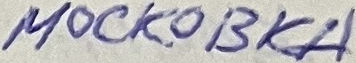московка
